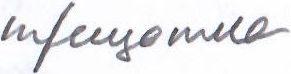трещотка
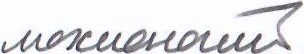мохноногий
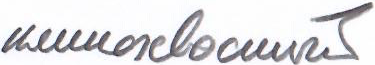клинохвостый
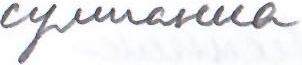султанка
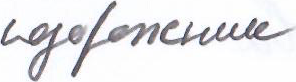подорожник
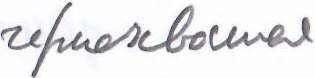чернохвостая
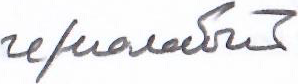чернолобый
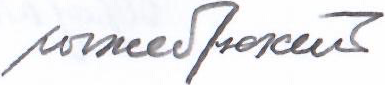рыжебрюхий
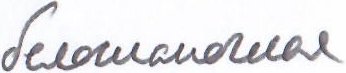белошапочная
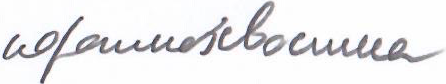короткохвостка
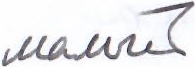малый
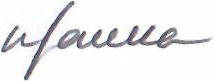крошка
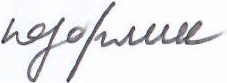подорлик
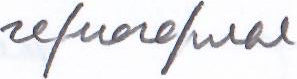черногорлая
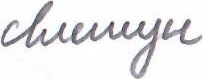свистун
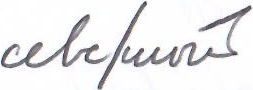северный
